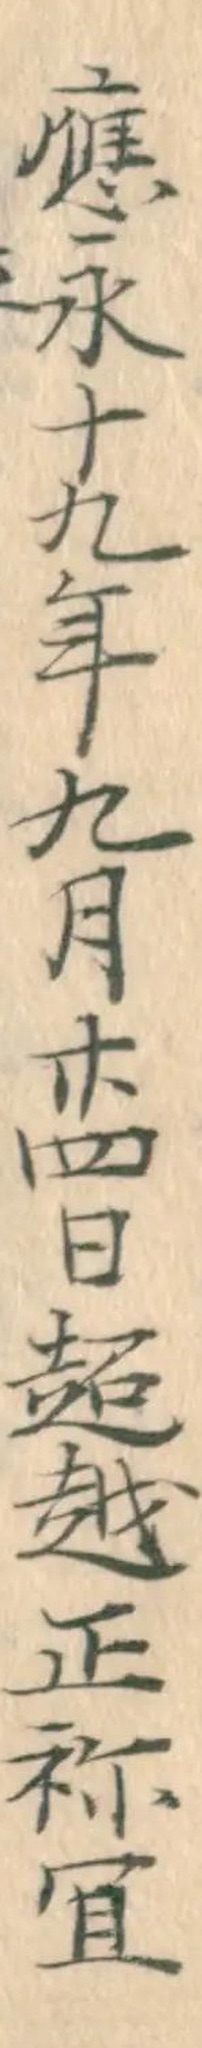広久応永十九年九月廿四日超越正祢宜
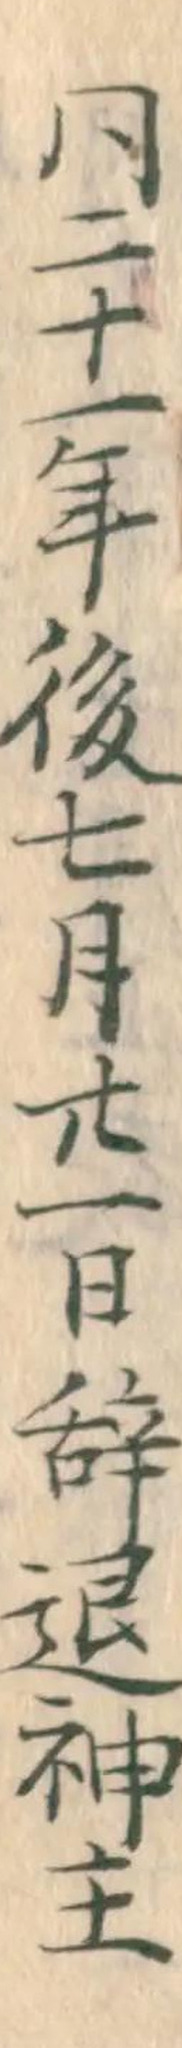同二十一年後七月廿一日辞退神主
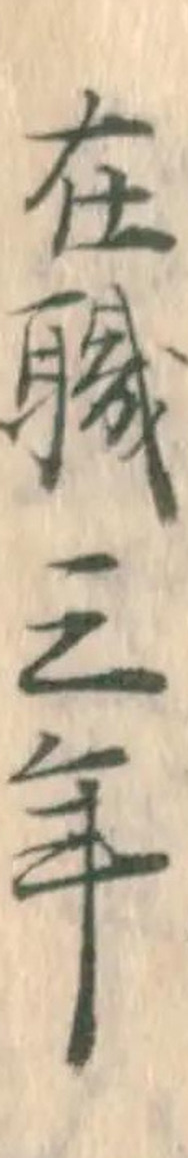在職三年
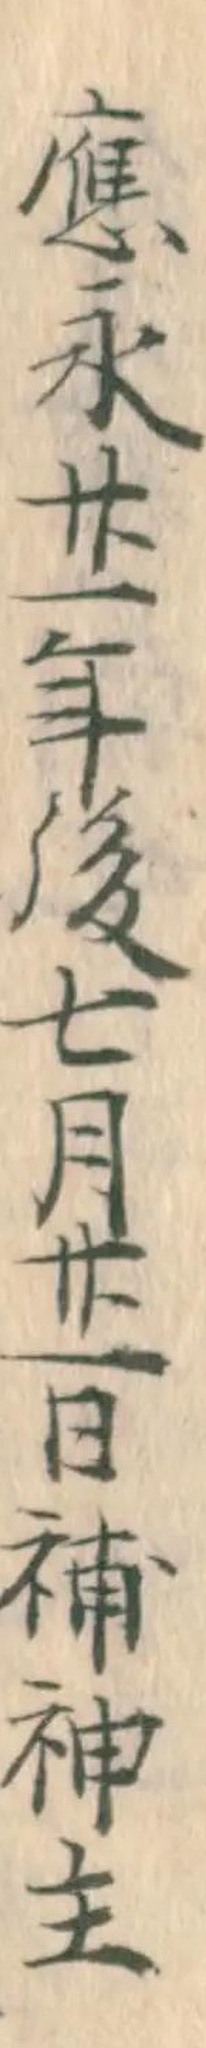豊平応永廿一年後七月廿一日補神主
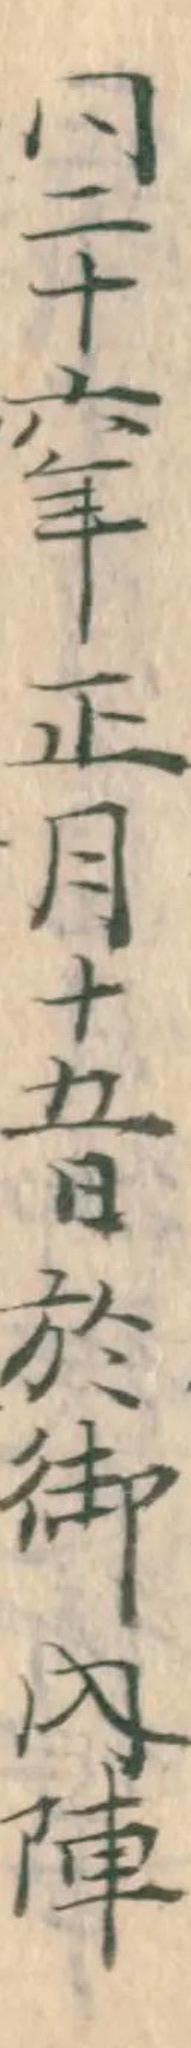同二十六年正月十五日於御内陣
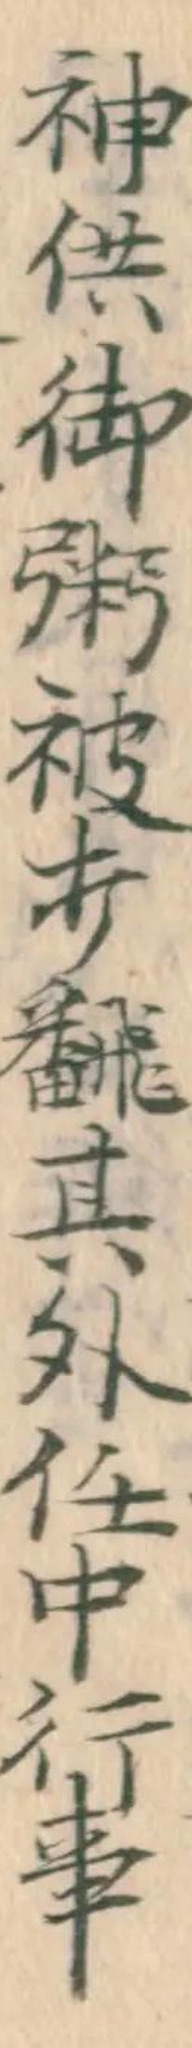神供御粥被打飜其外任中行事
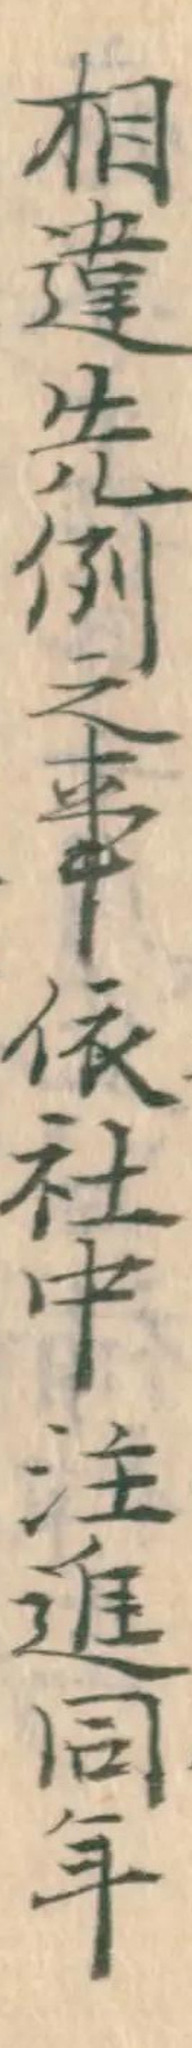相違先例之事依社中注進同年
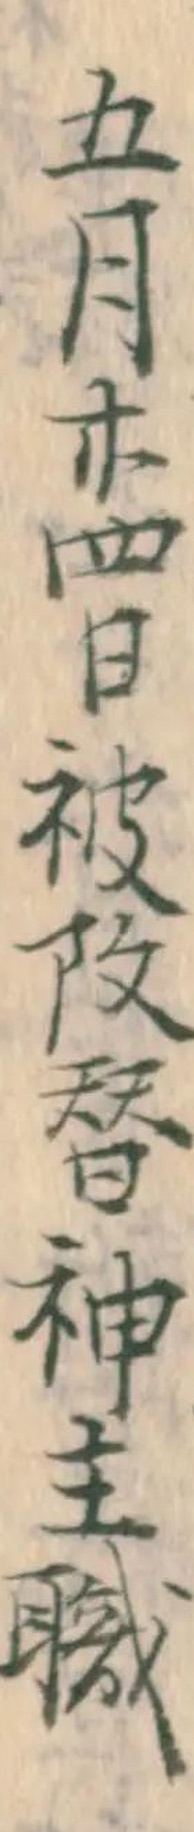五月廿四日被改替神主職
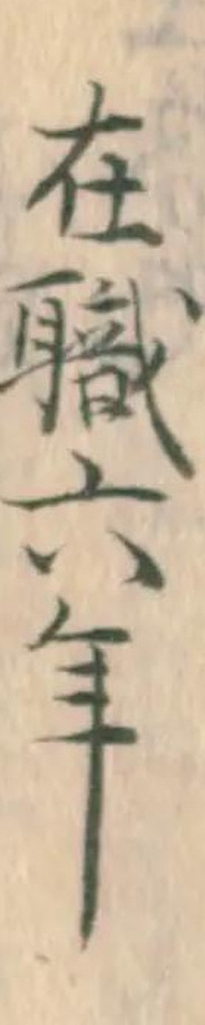在職六年
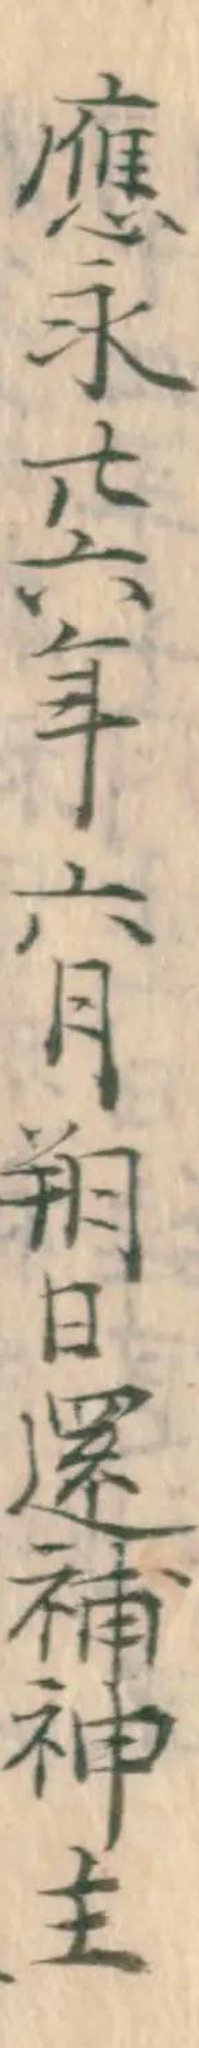広久応永廿六年六月朔日還補神主
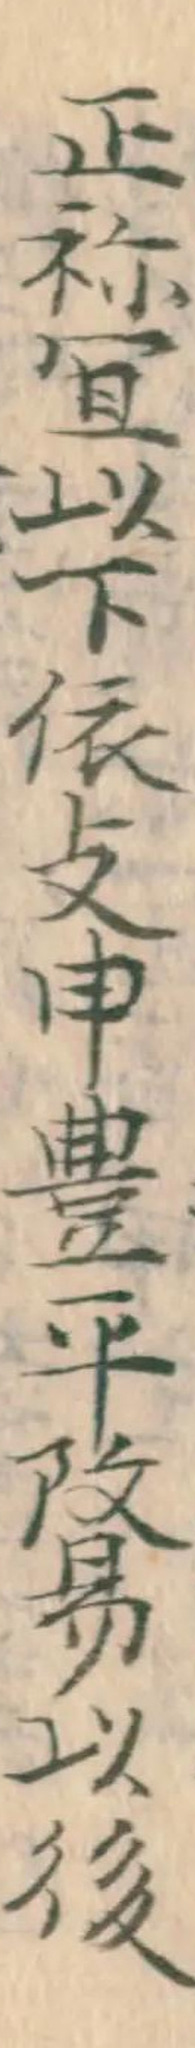正祢宜以下依支申豊平改易以後
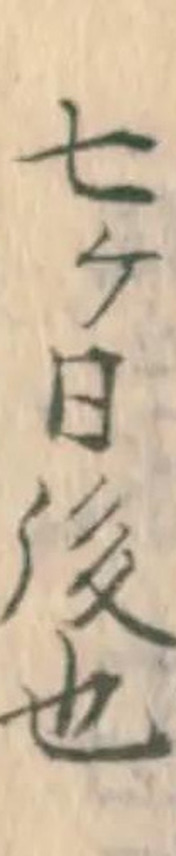七ヶ日後也
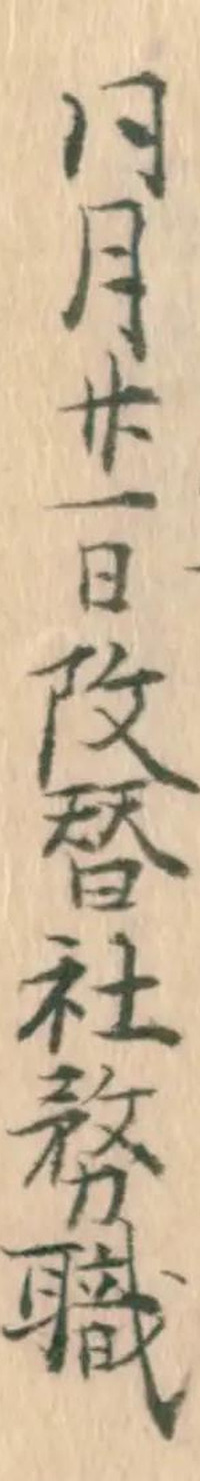同月廿一日改替社務職
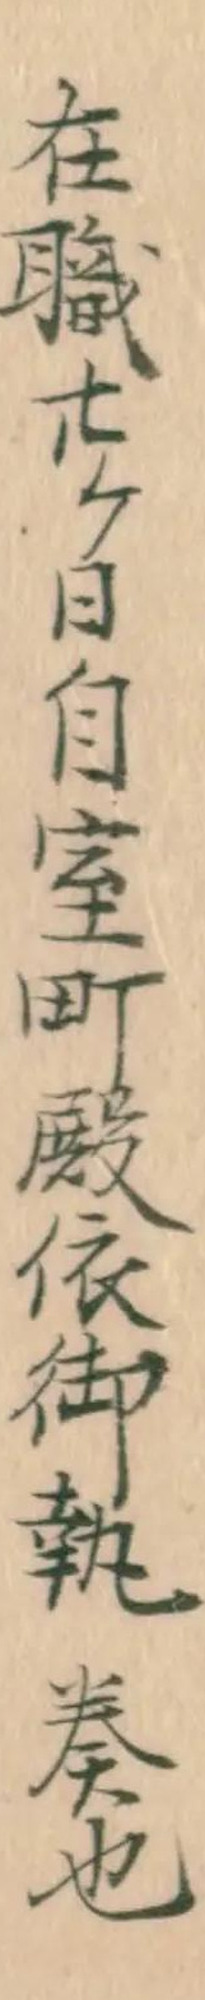在職廿ヶ日自室町殿依御執奏也
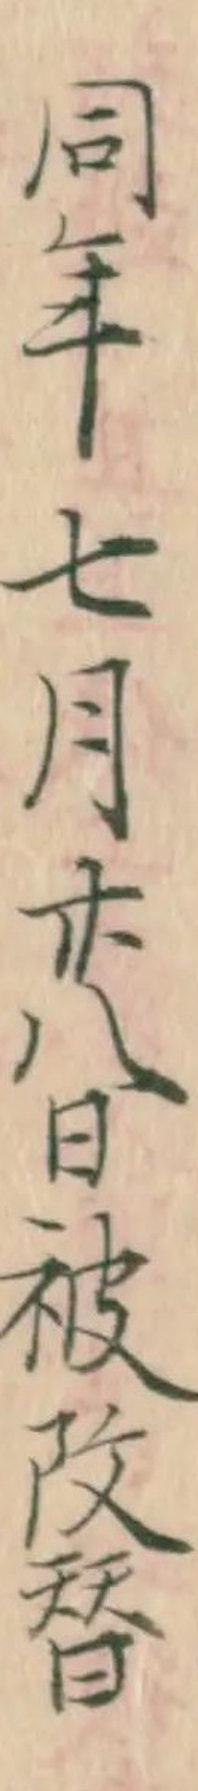同年七月廿八日被改替
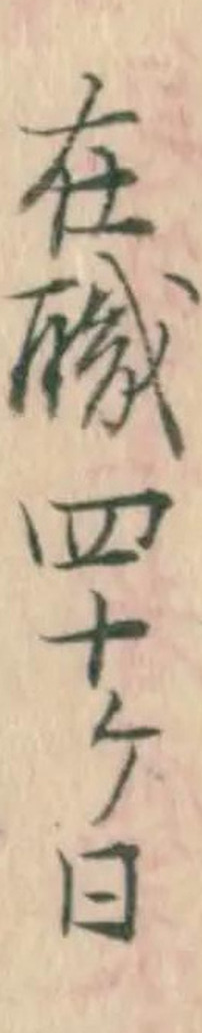在職四十ヶ日
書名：賀茂社記録. 第23冊
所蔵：国立国会図書館 National Diet Library, JAPAN
